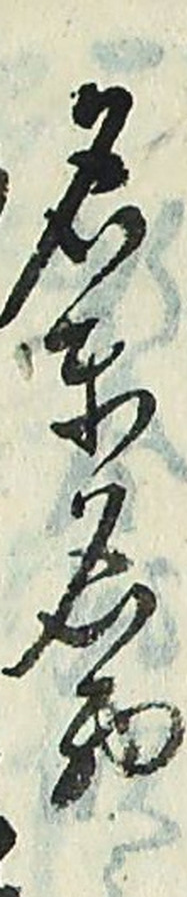名東名西
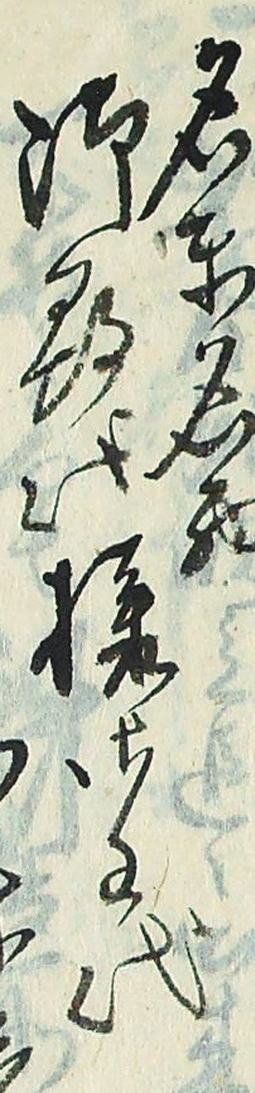御郡代様御手代
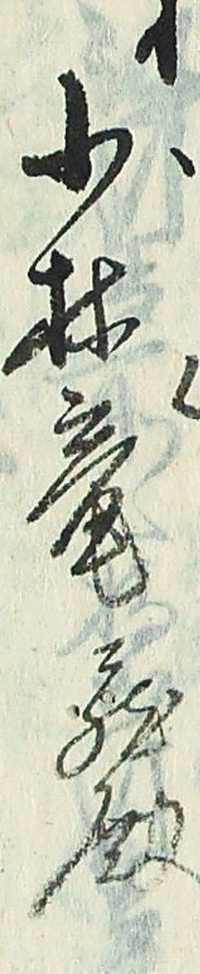小林竜蔵殿

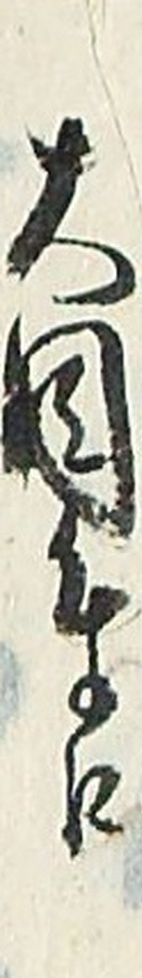大目付江
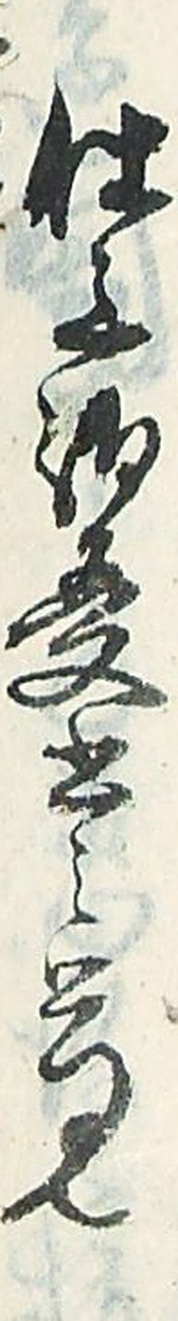仕上御受書之覚
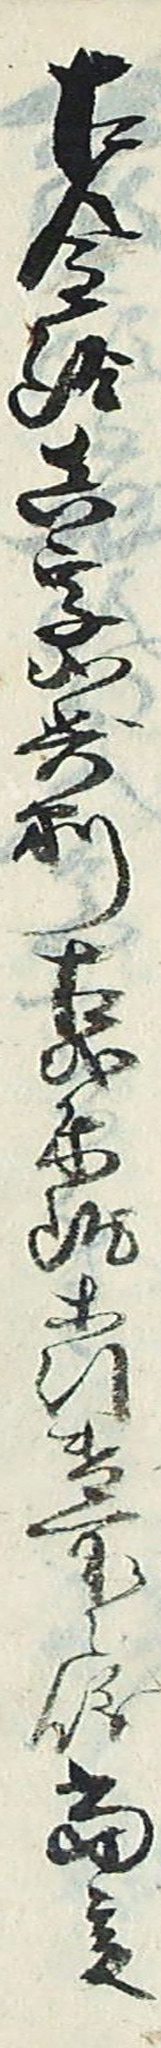古金銀真字弐歩判古弐朱銀等引替所之儀当亥
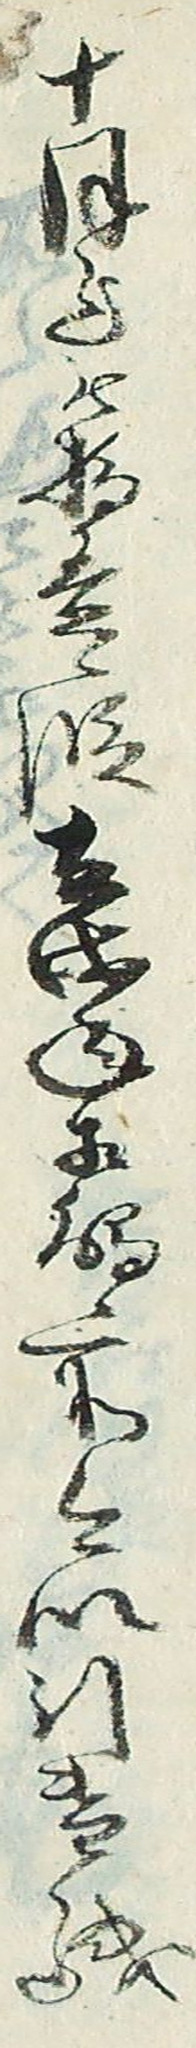十月迄被指置候段去戌年相触候所今以引替残
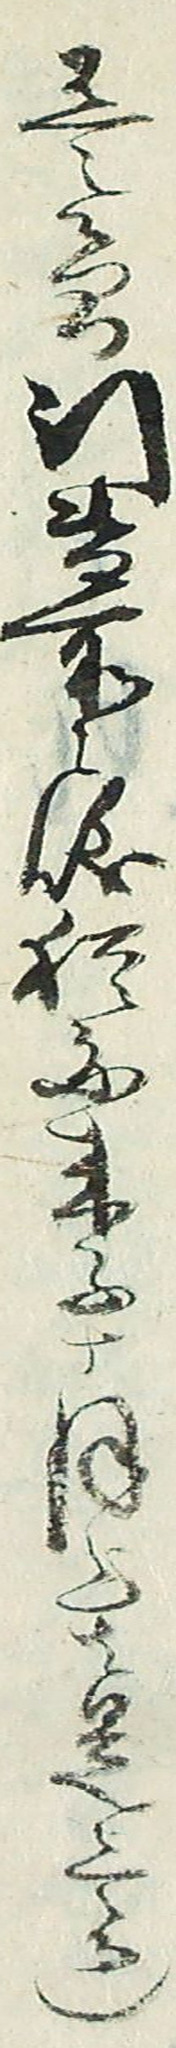有之候間引替所之儀猶亦来子十月迄は是迄之通
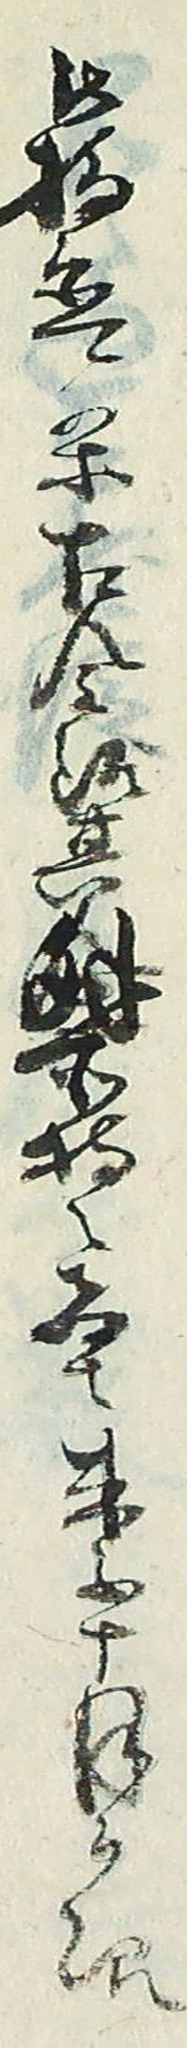被指置候条古金銀其外所持之者は来子十月を限
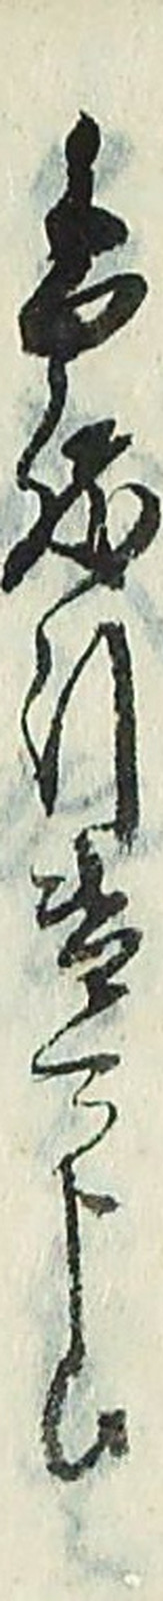急度引替可申候
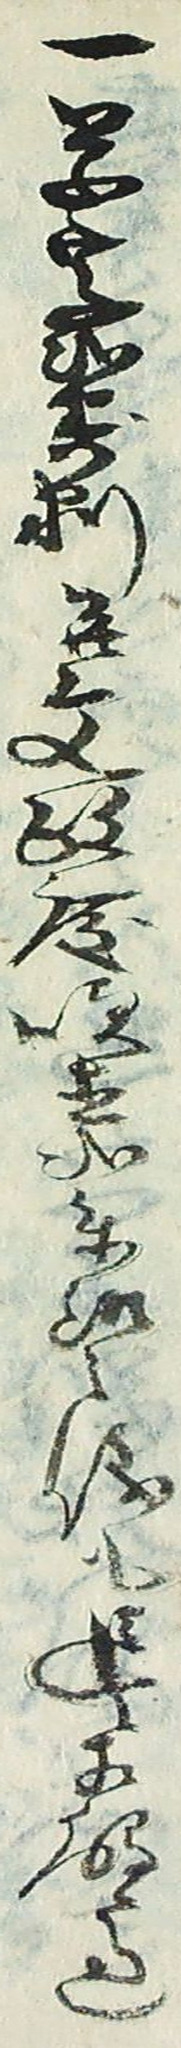一草字弐歩判幷文政度吹直弐朱銀之義も追々相触候通
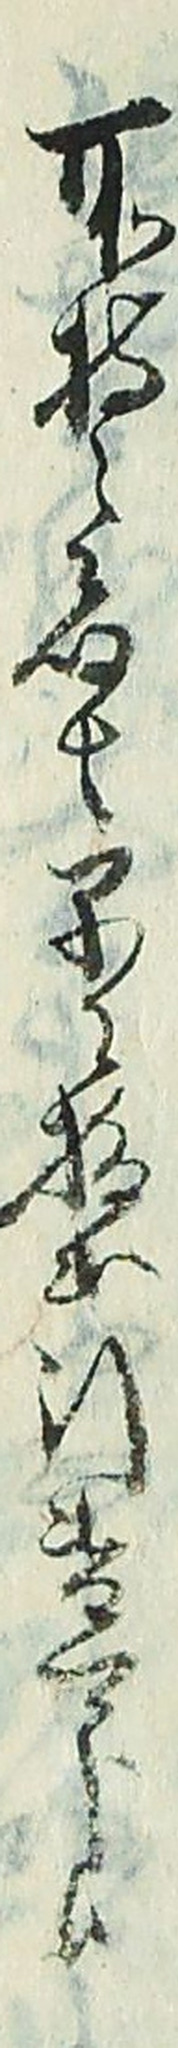所持之者は早々指出引替可申候
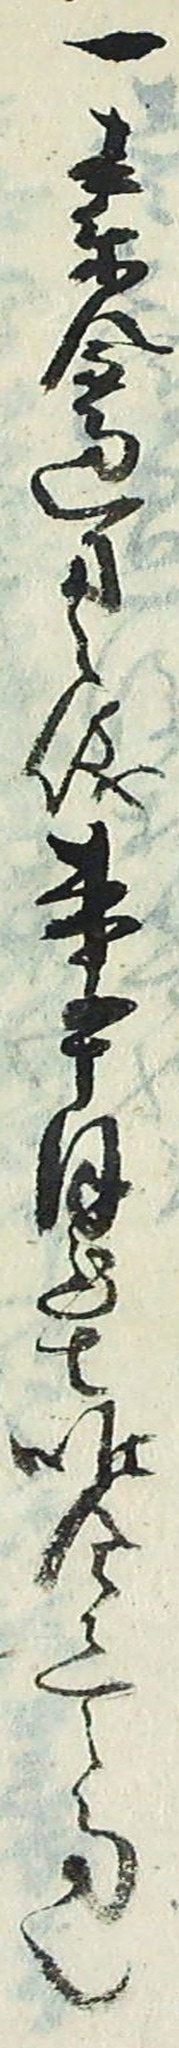一壱朱金通用之儀来子十月迄は唯今迄之通
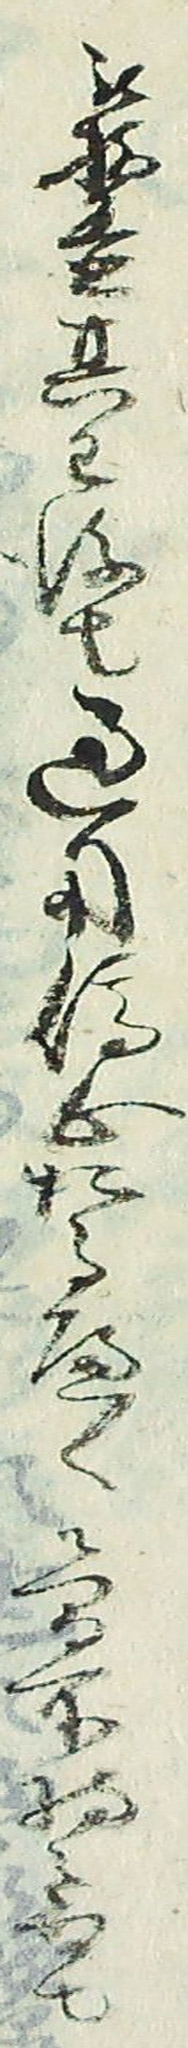被指置其已後は通用停止たるへく候間所持之者は
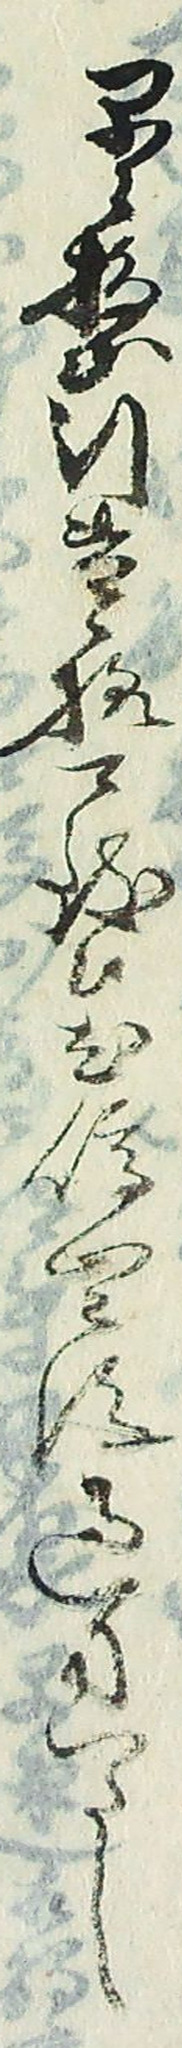早々指出引替候様可致候尤停止已後通用いたし
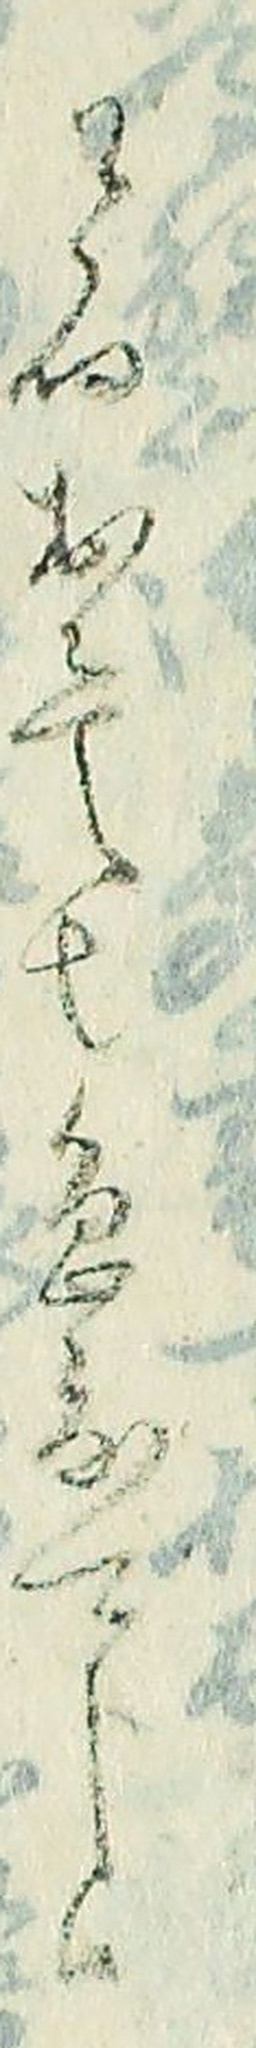候者於有之は急度可申候
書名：諸御用御□受書控
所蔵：鳴門教育大学 Naruto University of Education
